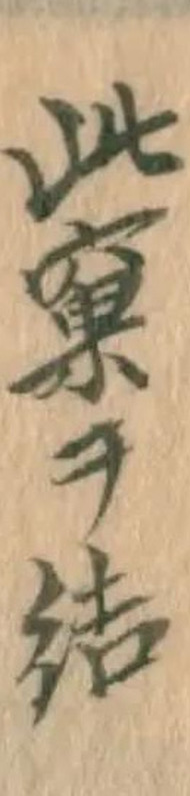此窠ヲ結
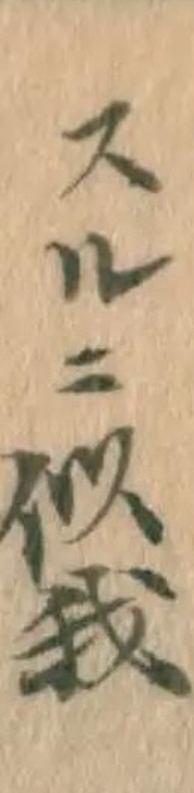スルニ似我
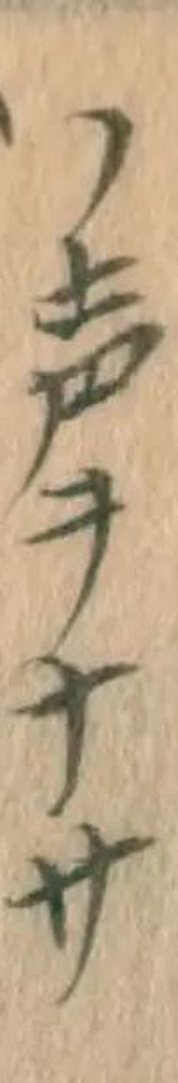ノ声ヲナサ
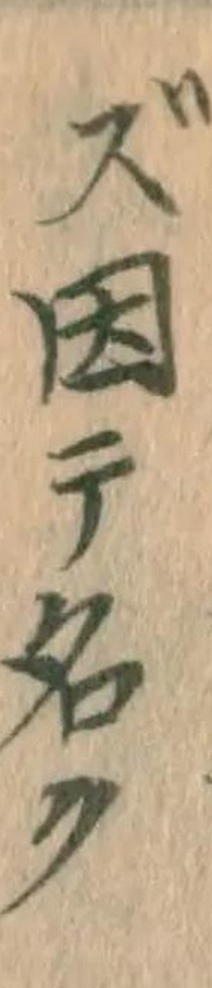ズ因テ名ク
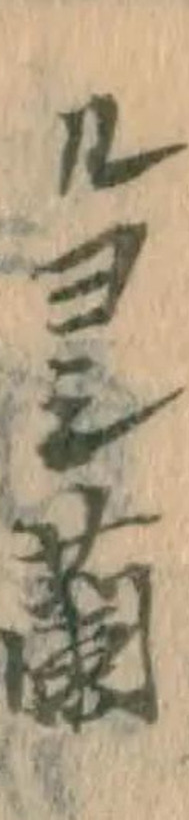ルヨシ蘭
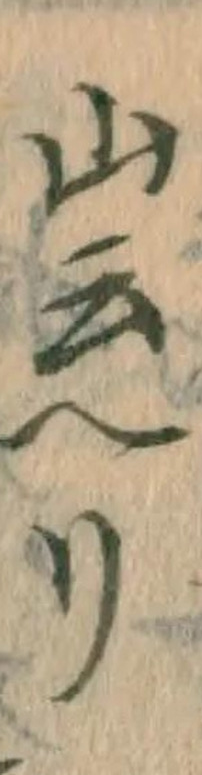山云ヘリ
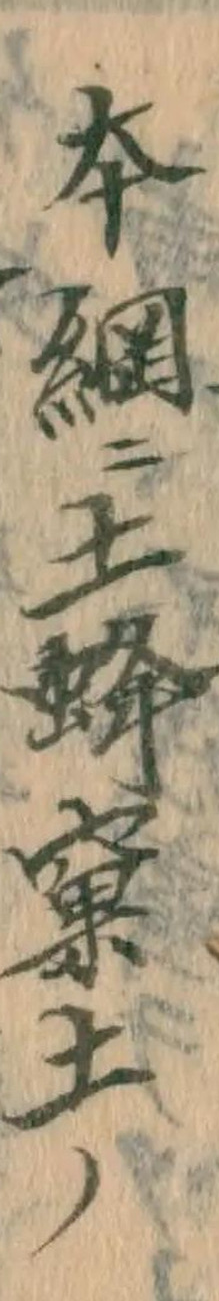本網ニ土蜂窠土ノ
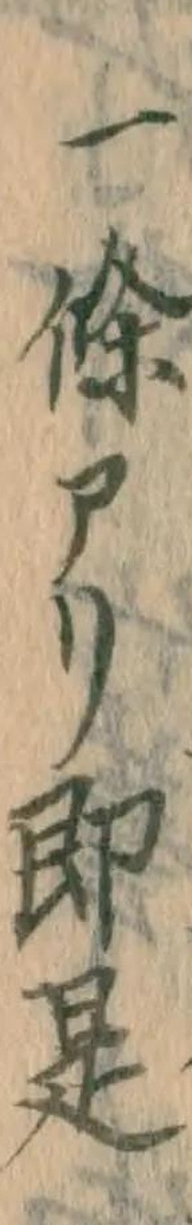一條アリ即是
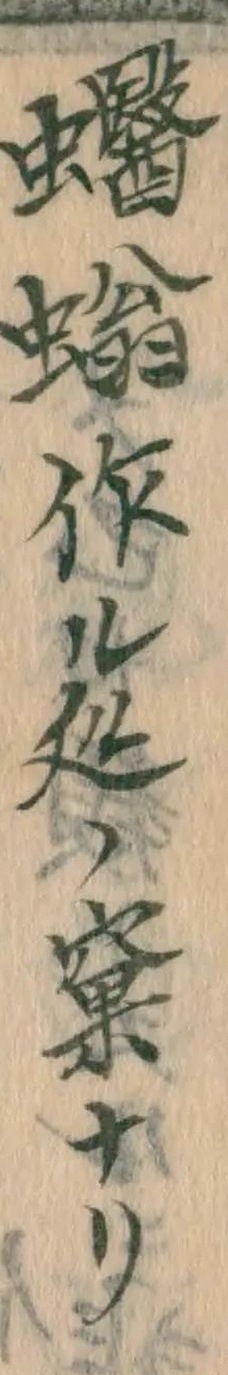螉作ル処ノ窠ナリ
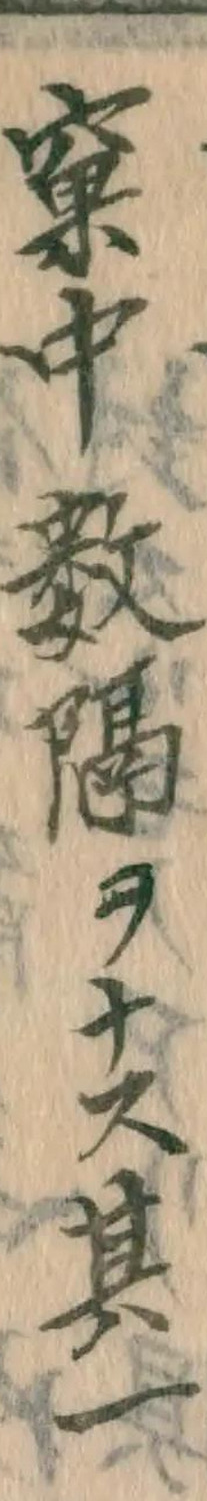窠中数隅ヲナス其一
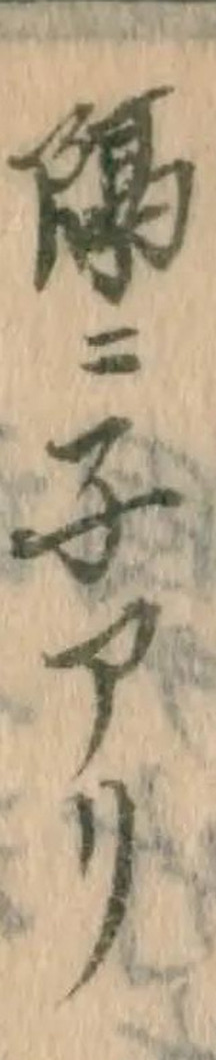隅ニ子アリ

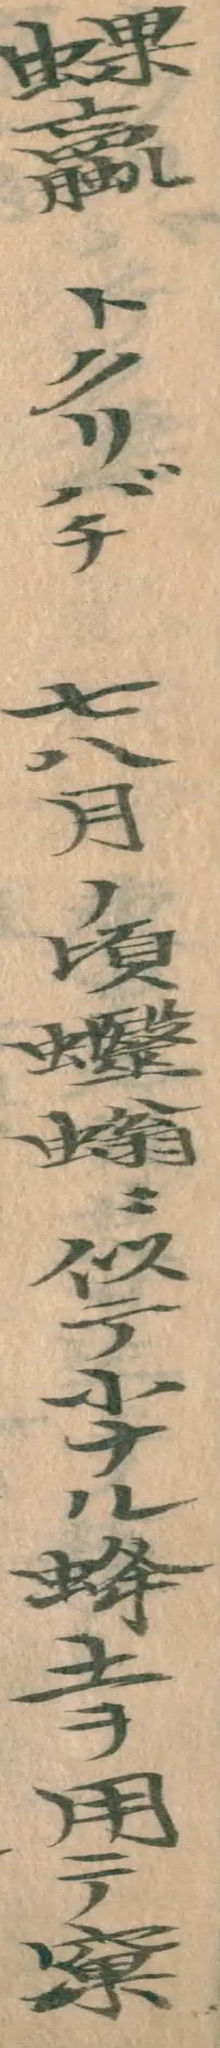蜾臝トクリバチ七ハ月ノ頃螉ニ似テ小ナル蜂土ヲ用テ窠
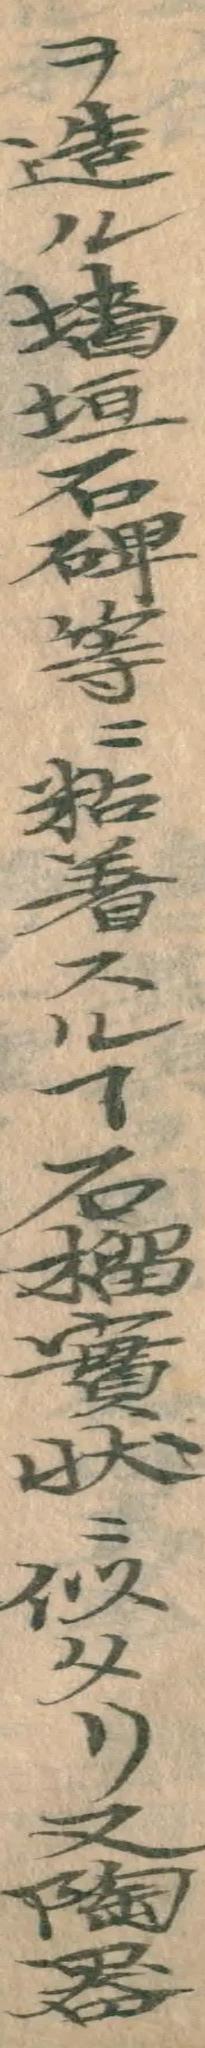ヲ造ル墻垣石碑等ニ粘着スルコト石榴實状ニ似タリ又陶器
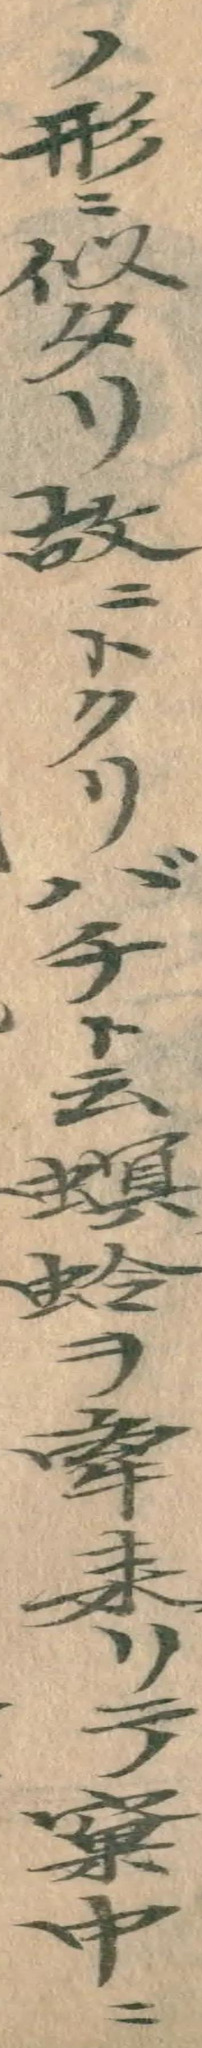ノ形ニ似タリ故ニトクリバチト云螟蛉ヲ牽来リテ窠中ニ
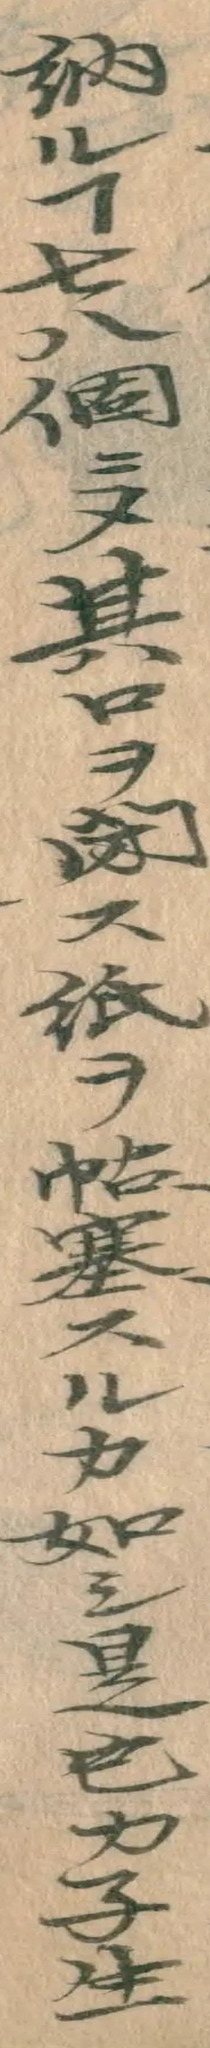納ルコト七八個ニシテ其口ヲ閉ス紙ヲ帖塞スルカ如シ是已力子生
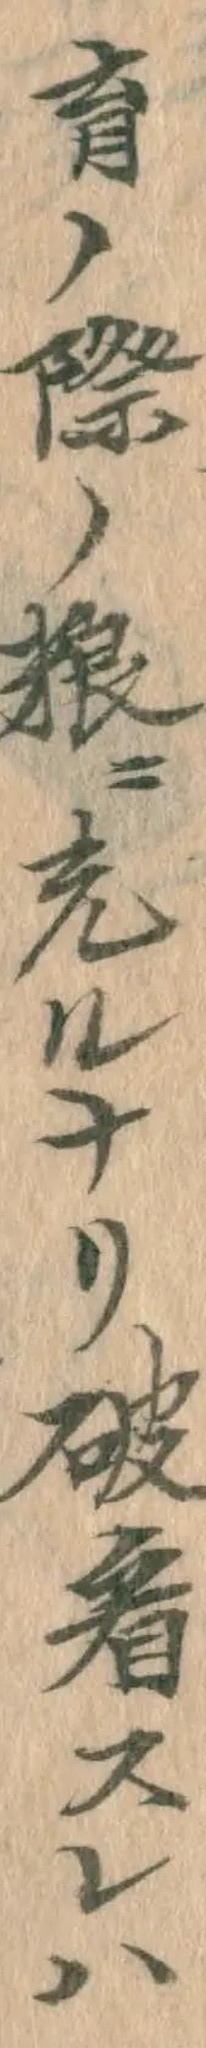育ノ際ノ粮ニ充ルナリ破看スレハ
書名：千蟲譜 3巻. [2]
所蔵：国立国会図書館 National Diet Library, JAPAN
